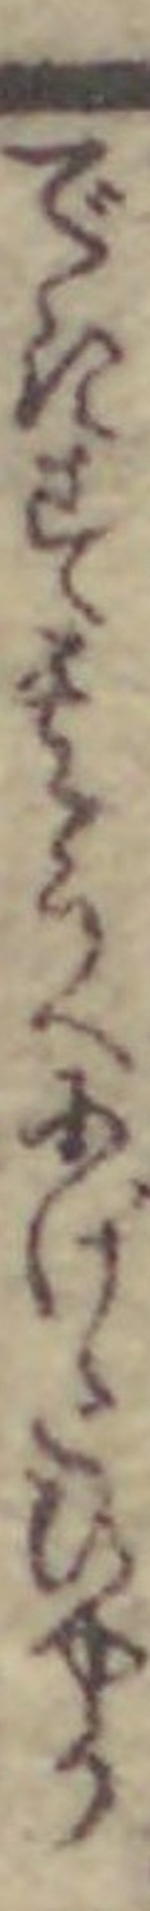できす其うへにげたひやう
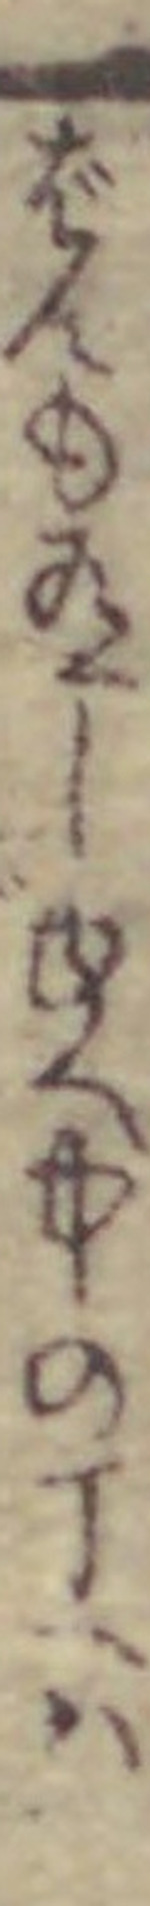ばんも有しゆへ中の丁へは
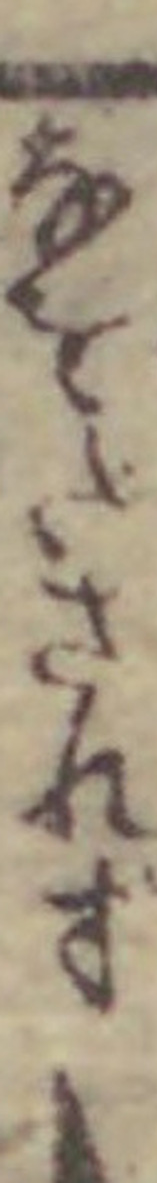なをたされず
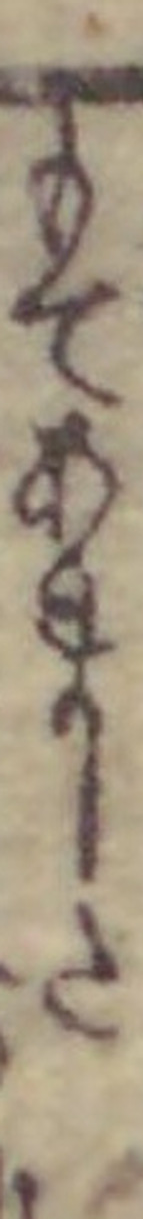もてあました
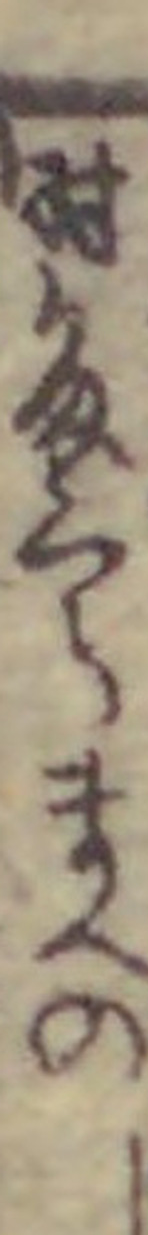時かまくらまへの
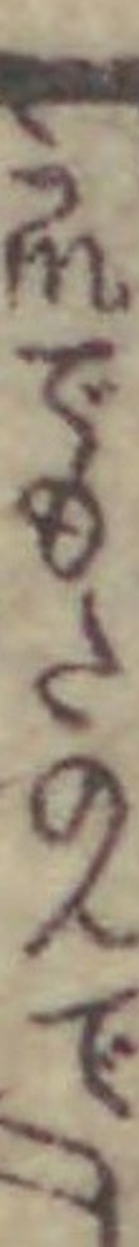衆でもたのんで
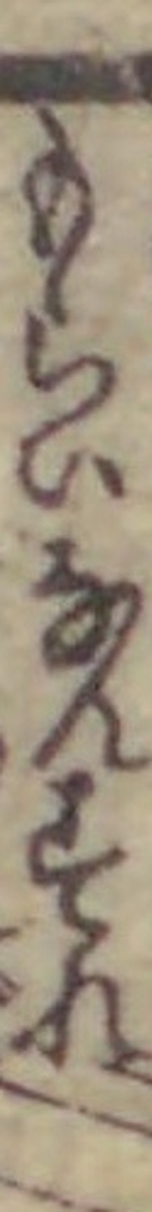もらいなんすれ
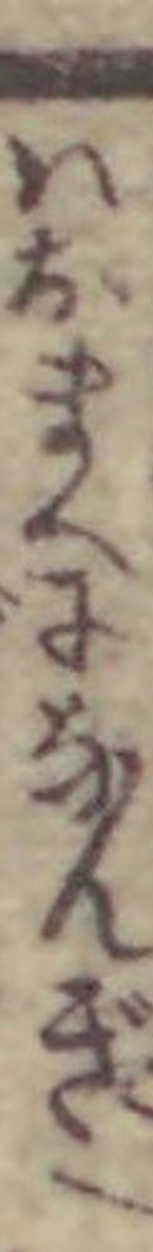はおまへになんぎ
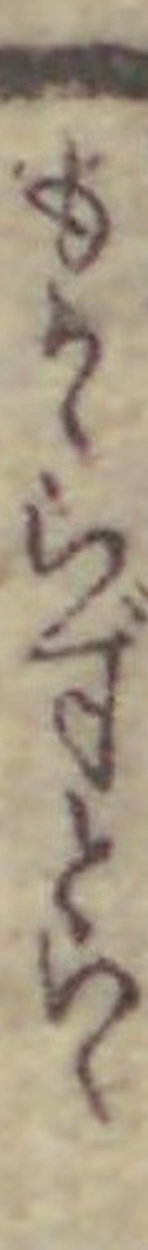もかヽらずといゝ
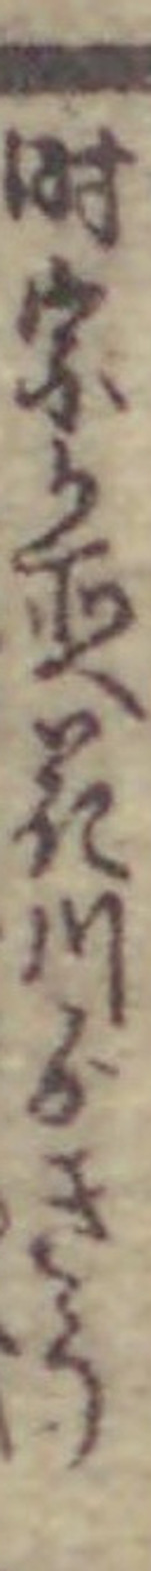時宗か所へ花川よりきう
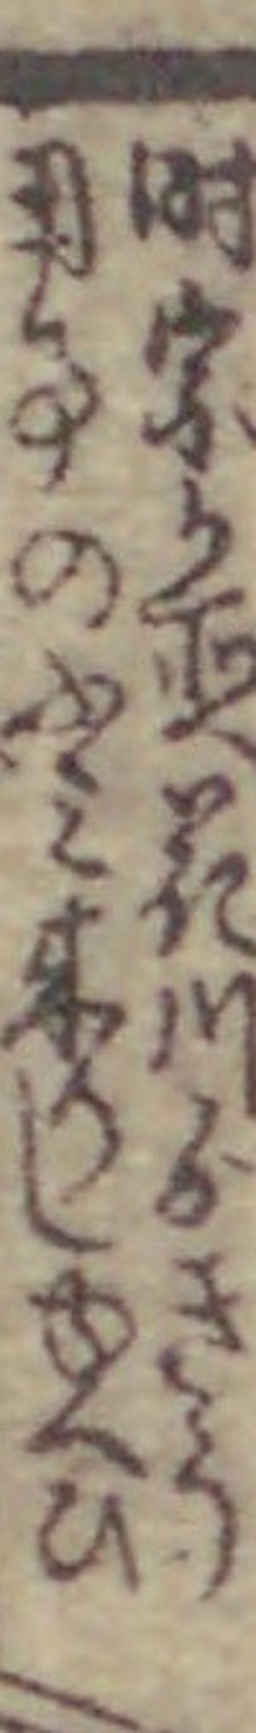用事のふみ来りしゆへひ
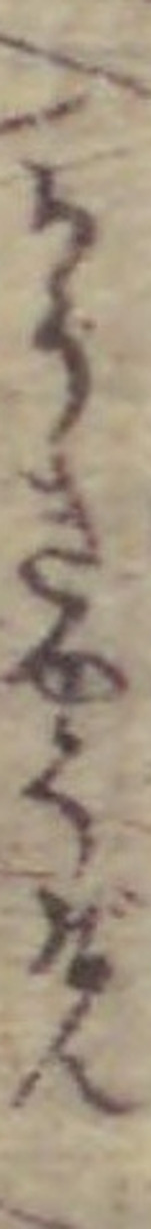かうきやうげん
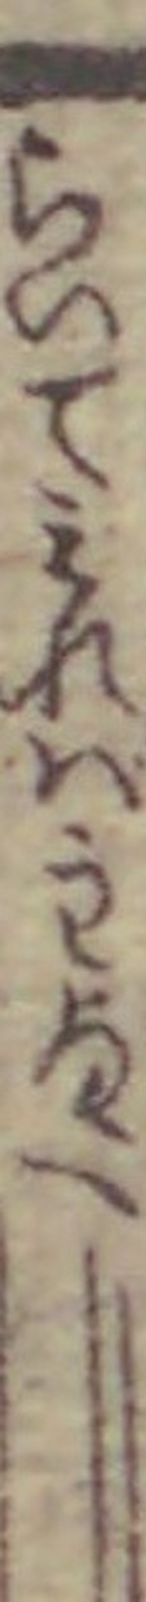らいてみれば主さまへ
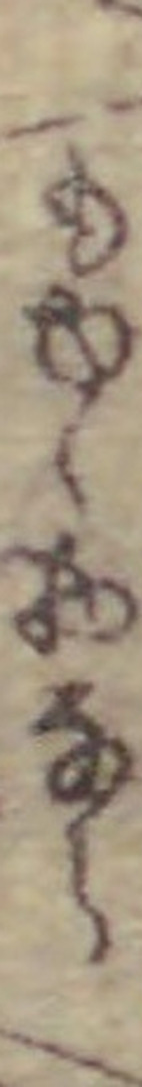もゆく物なら
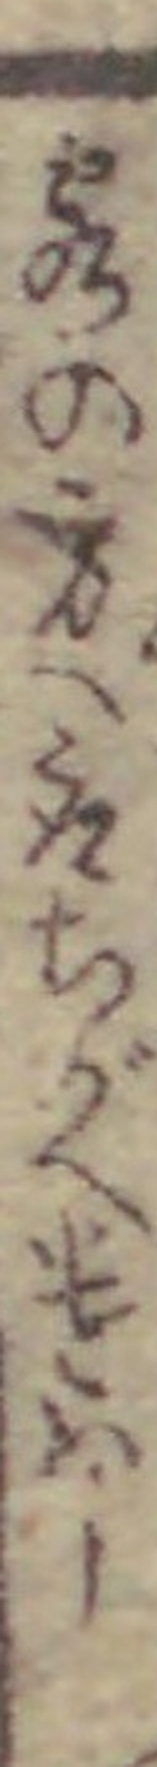客の方へ取ちがへ遣はし
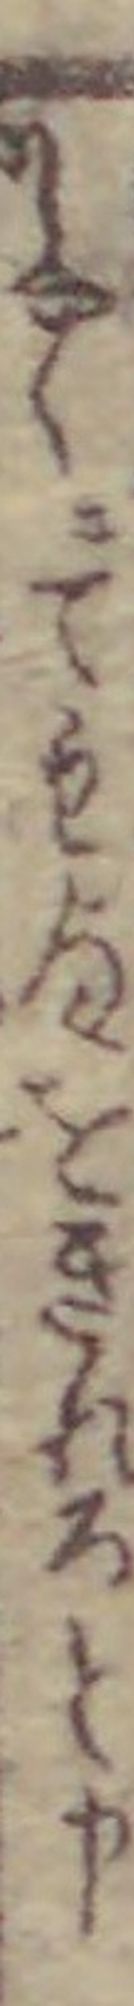しやくにて主さまをきれろと申
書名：間似合嘘言曽我 3巻
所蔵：国立国会図書館 National Diet Library, JAPAN
